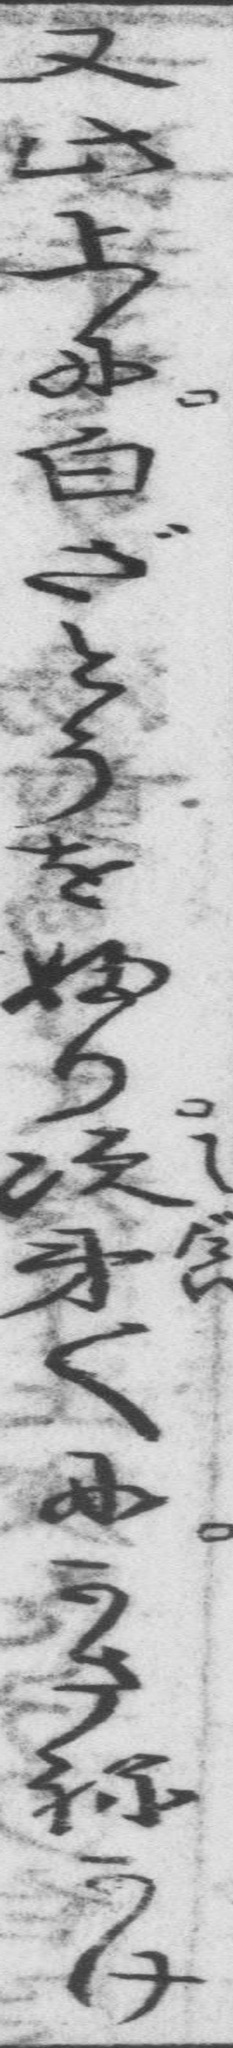又此上に。白ざとうをふり。次第〳〵に。かさねかけ
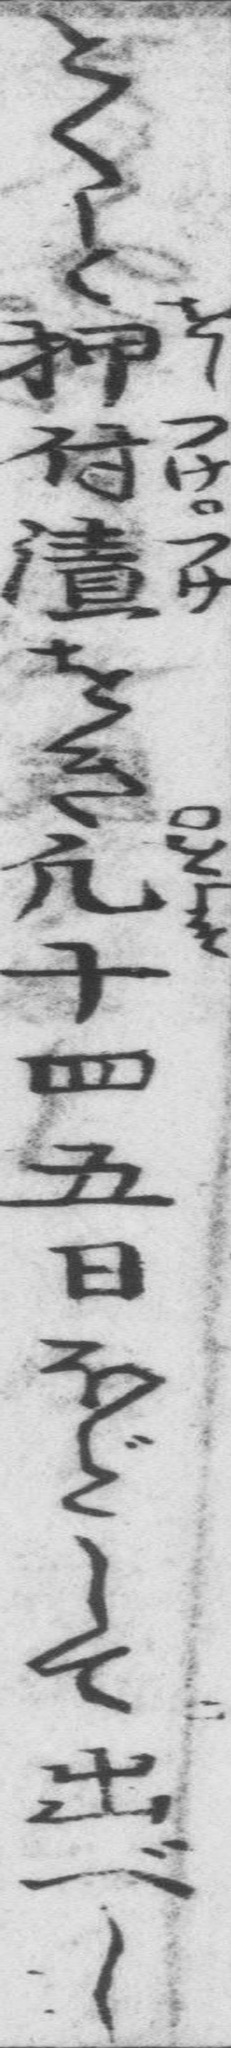とくと押付。漬をき。凡十四五日ほどして。出べし
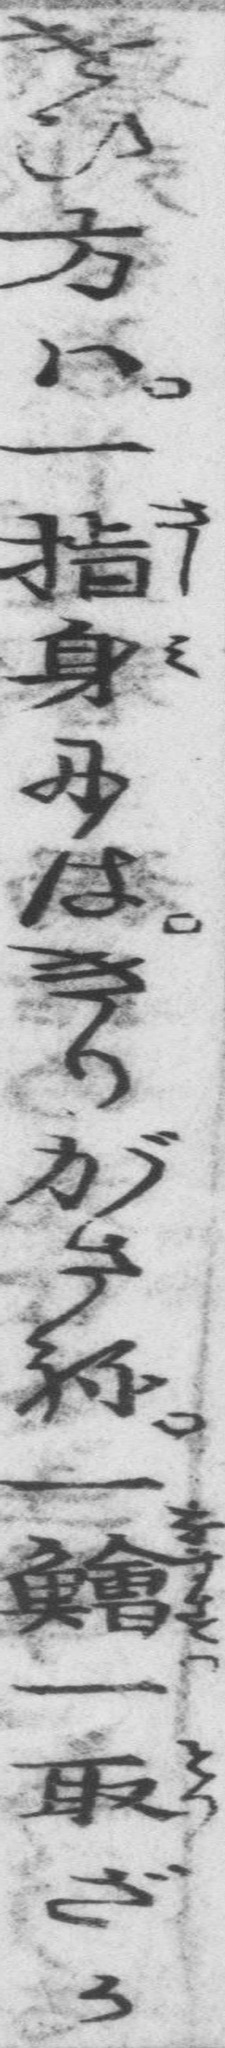遣ひ方は。一指身には。きりがさね。一鱠。一取ざか
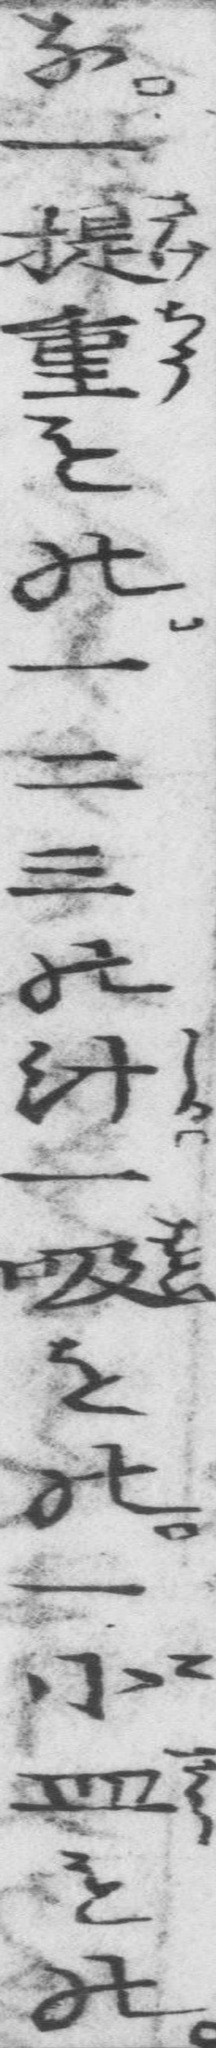な。一提重もの。一二三の汁。一吸もの。一小皿もの。
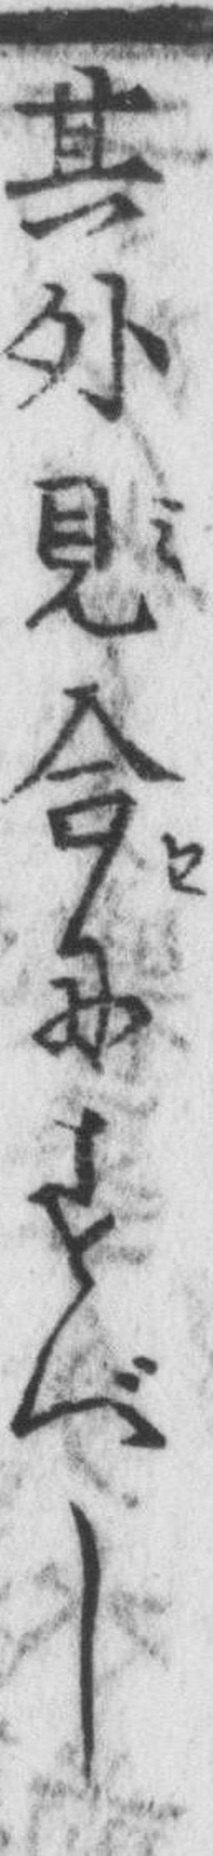其外見合せにすべし
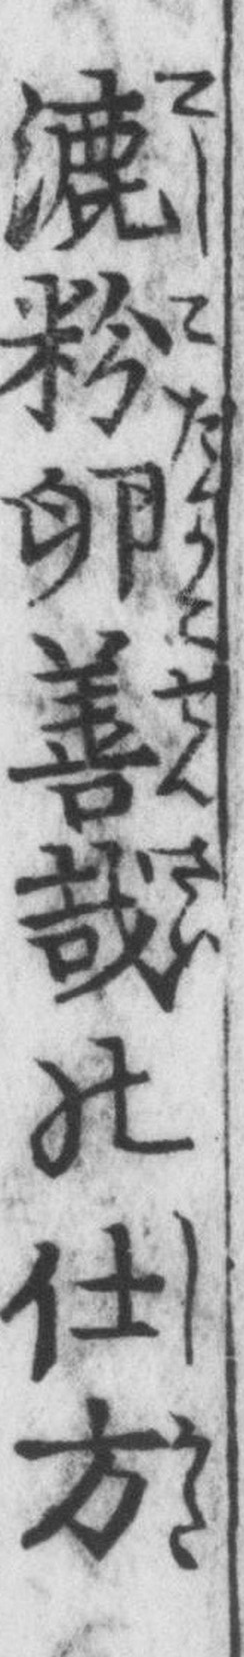漉粉卵善哉の仕方
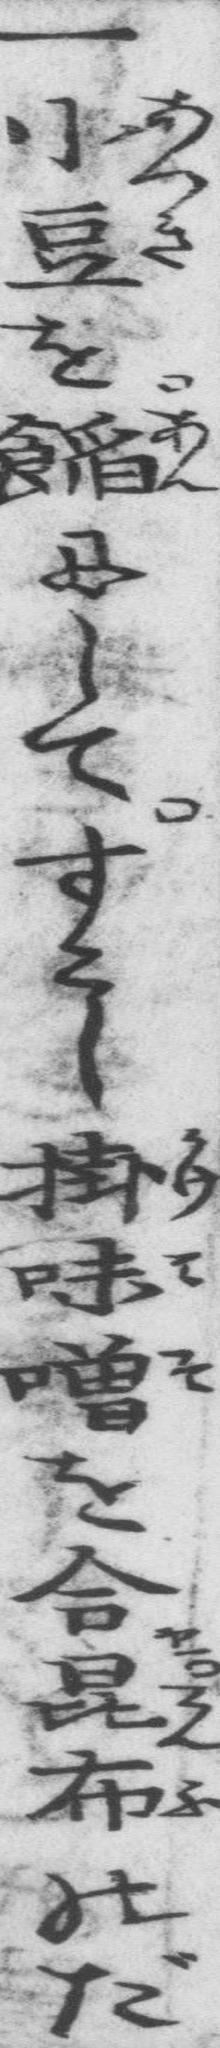一小豆を。餡にして。すこし掛味噌を合せ。昆布のだ

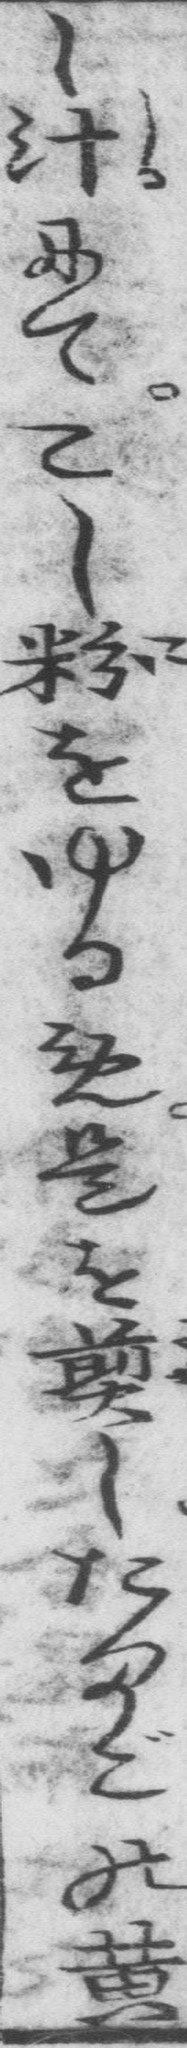し汁にて。こし粉をゆるめ。是を煎し。たまごの黄
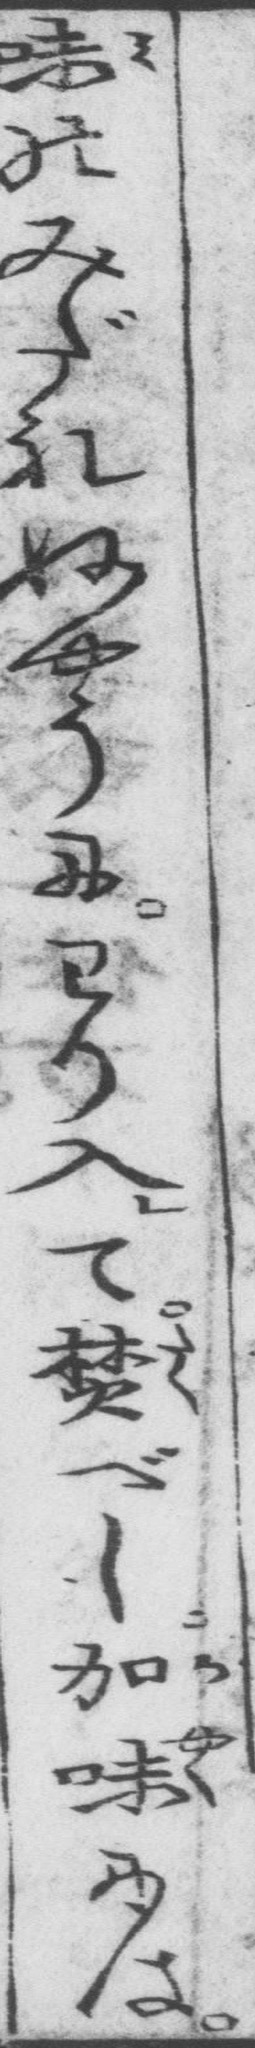味のみだれぬやうに。わり入れて。焚べし。加味には。
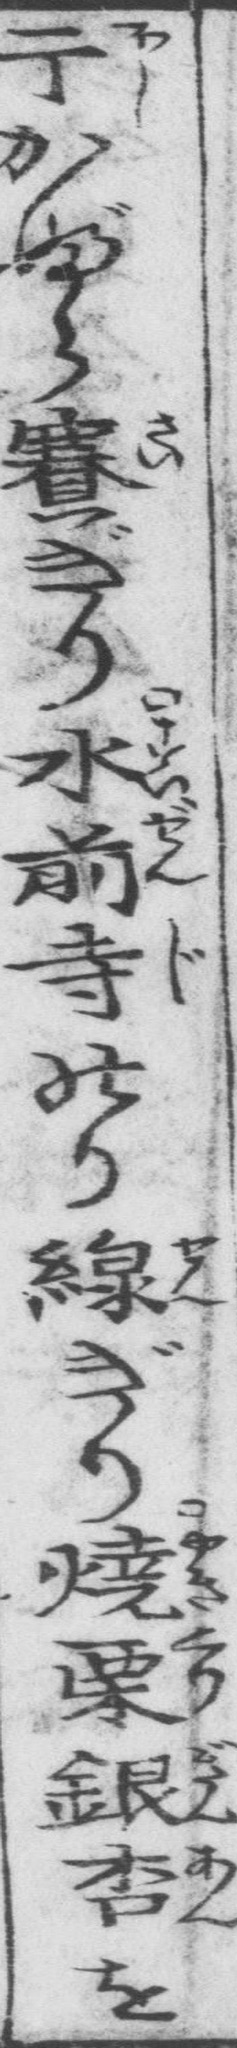干かぶら賽ぎり。水前寺のり線ぎり。焼栗銀杏を
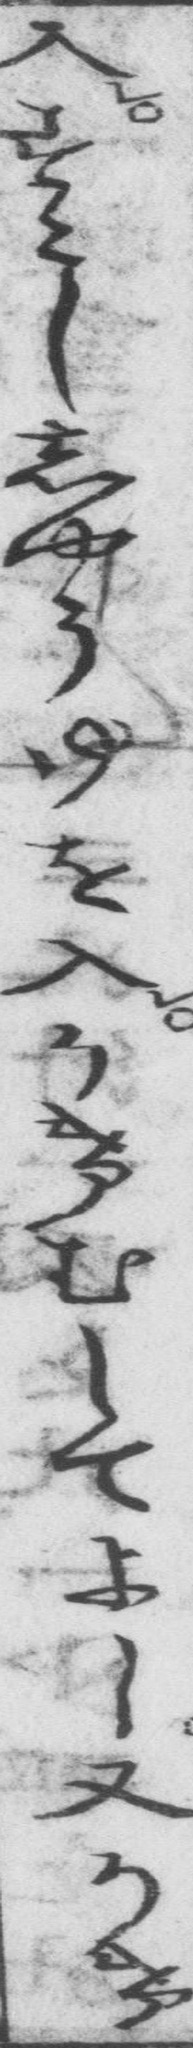入れ。すこいしやうゆを入れ。かけむしてよし。又かけ
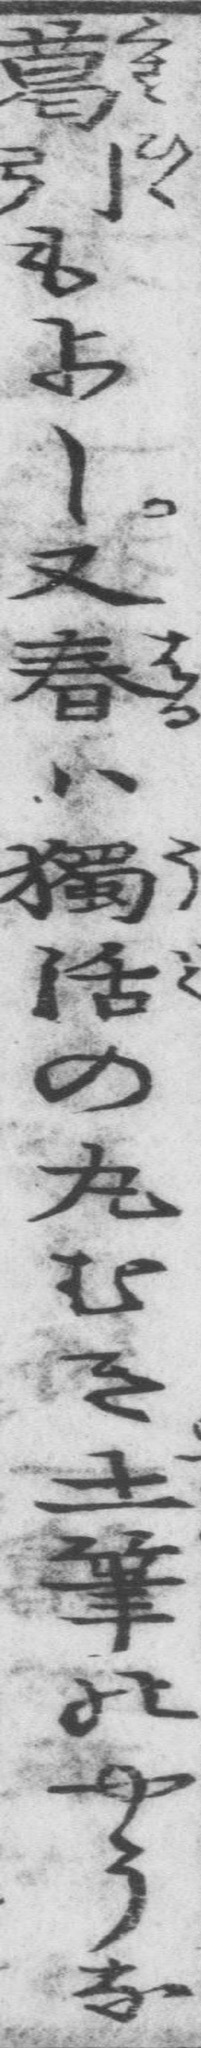葛引もよし。又春は独活の丸むき。土筆のやうな
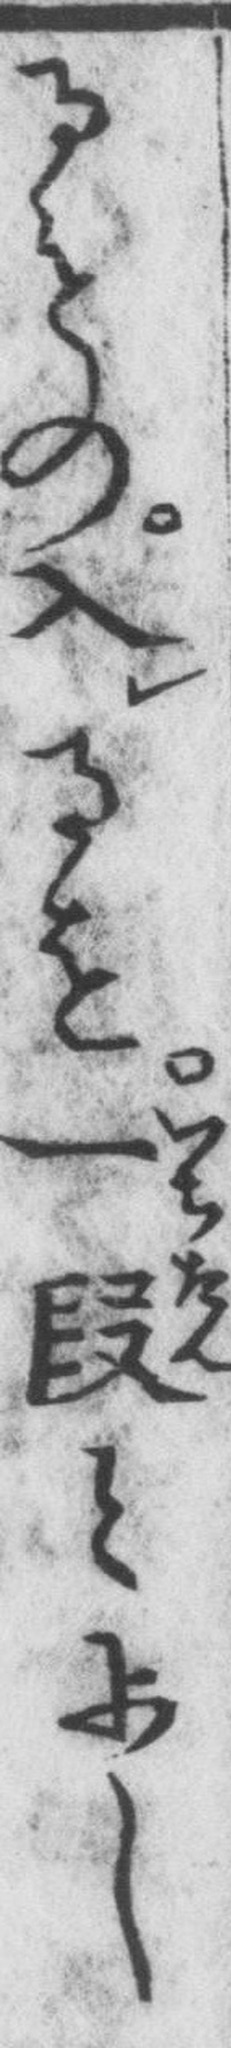るもの。入れるを。一段とよし
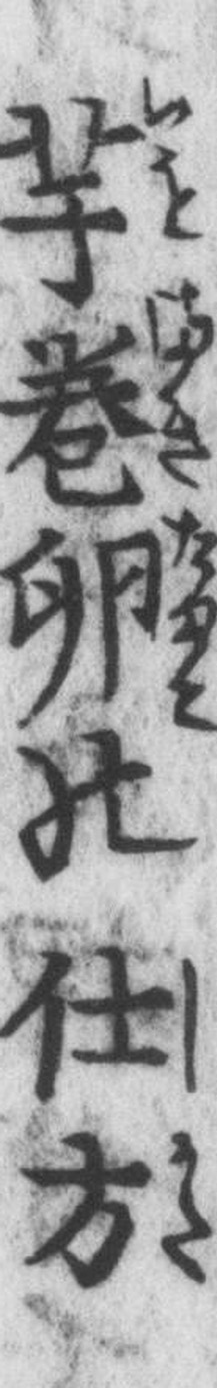芋巻卵の仕方
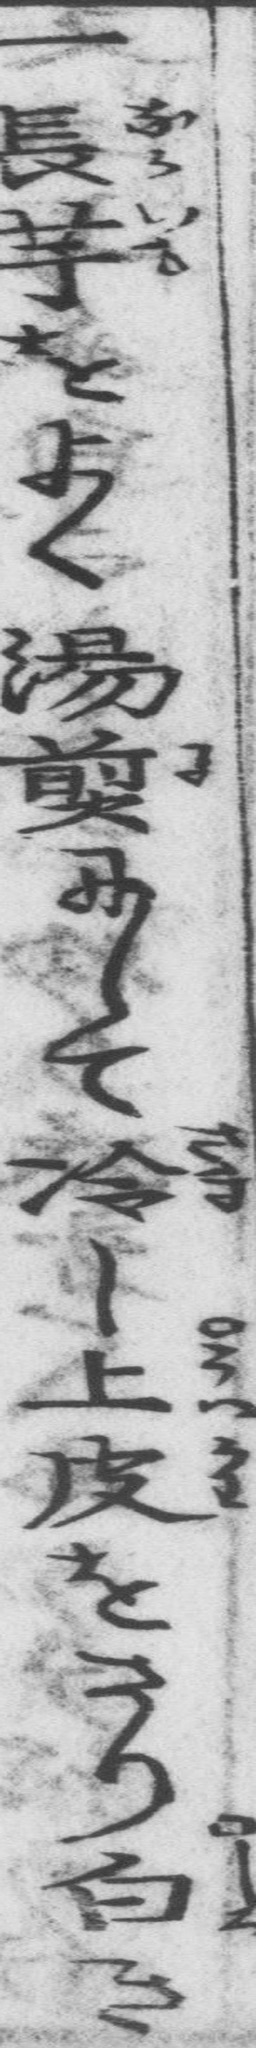一長芋をよく湯煎にして冷し。上皮をさり。白き
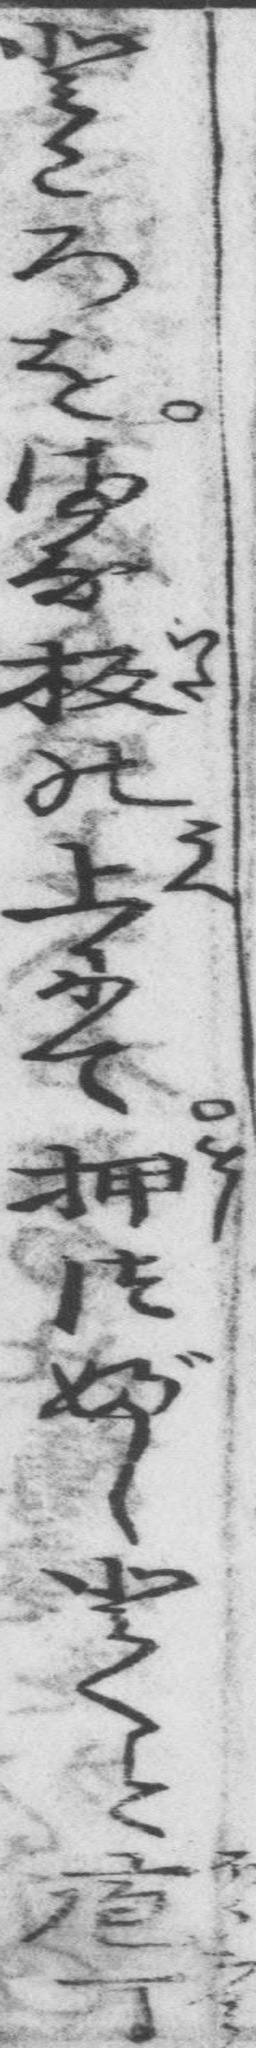ところを。まな板の上にて。押つぶしとくと包丁
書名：萬寳料理秘密箱
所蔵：大阪府立大学学術情報センター 国文学研究資料館
